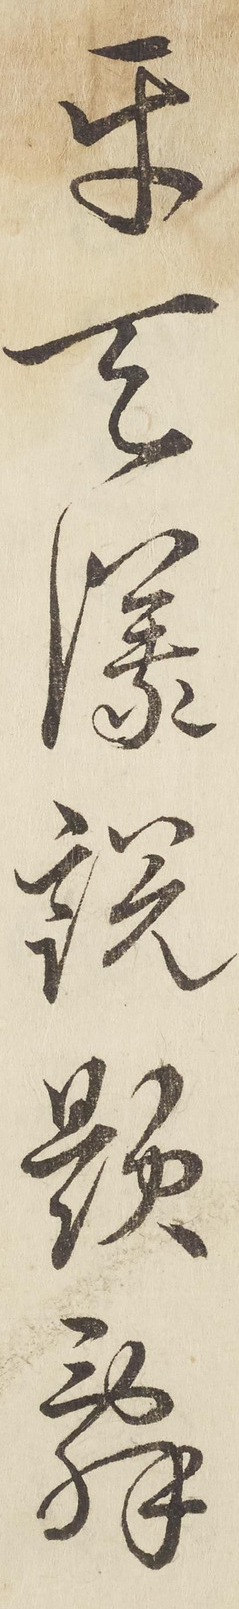平天儀説題辞
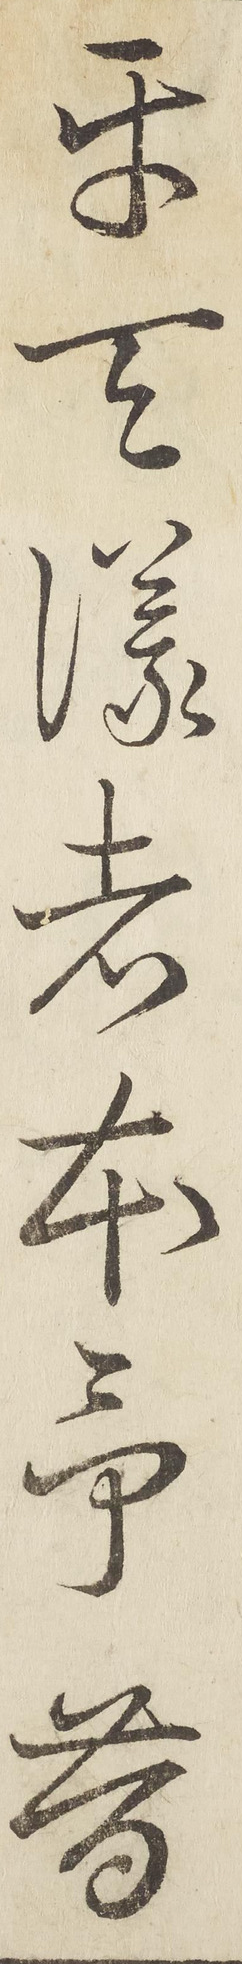平天儀者本予昔
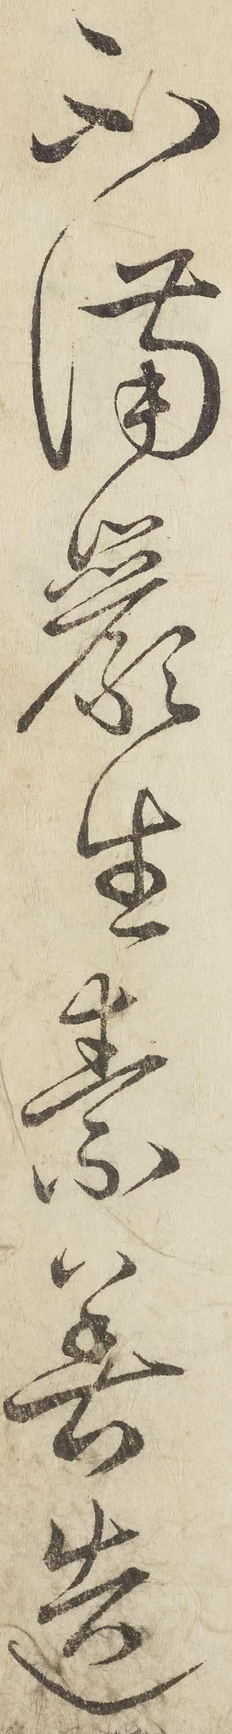不備巌生素善造

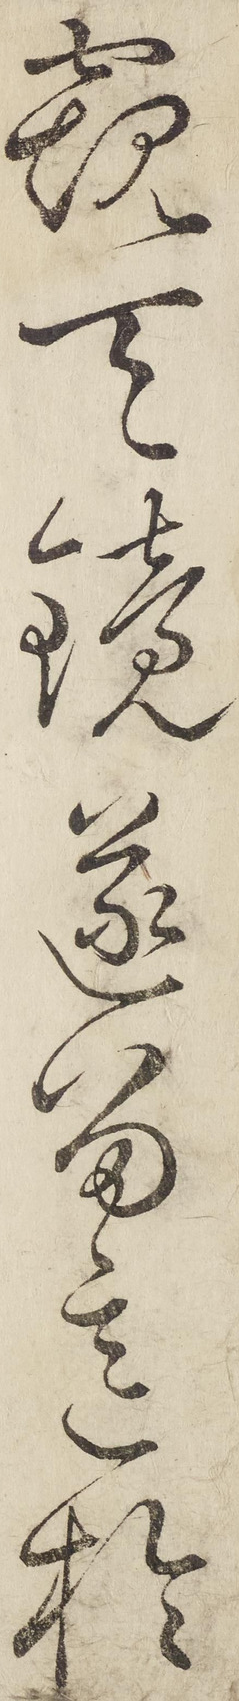窺天鏡遂留意於
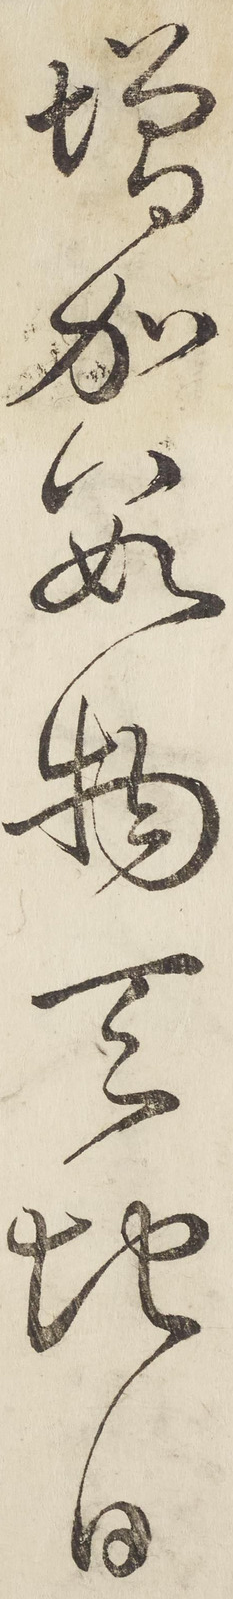増加数物天地日
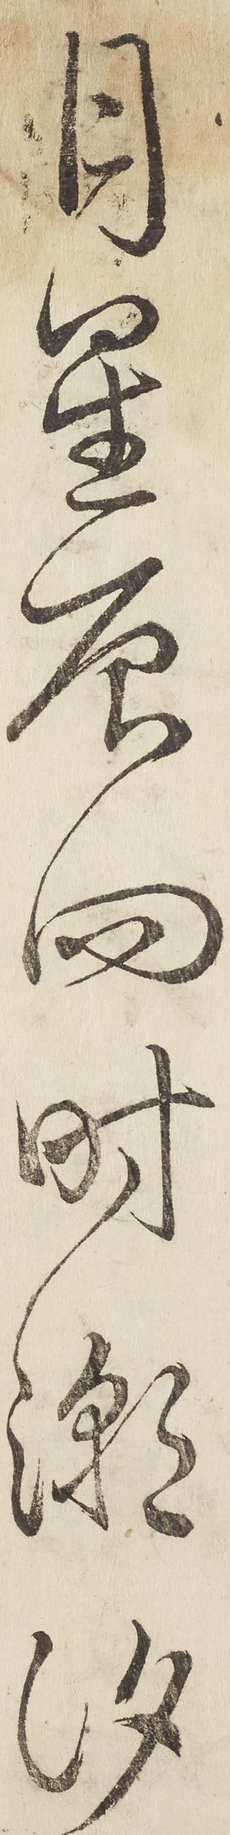月星辰四時潮汐
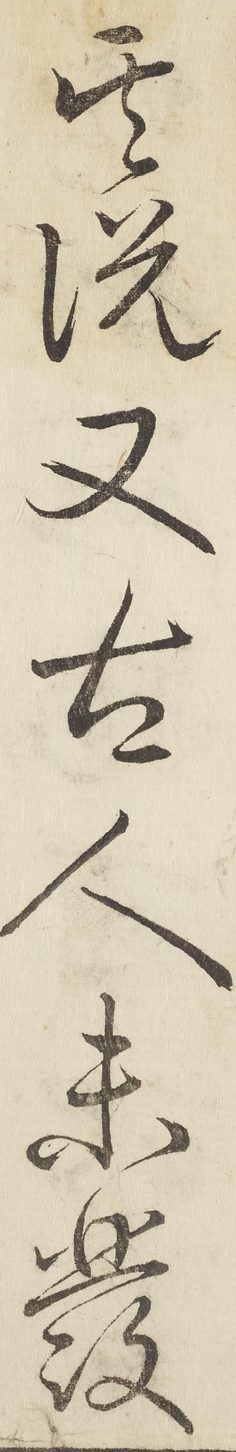其説又古人未発
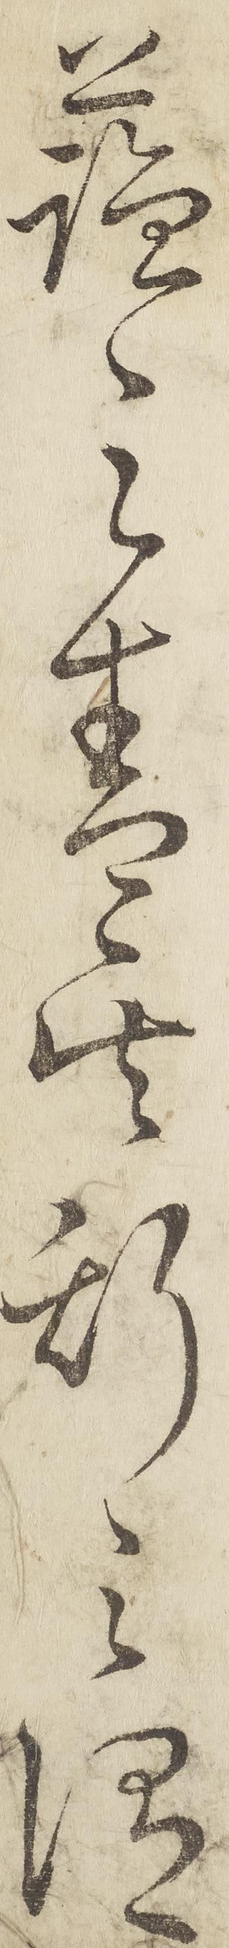藍之青其斯之謂

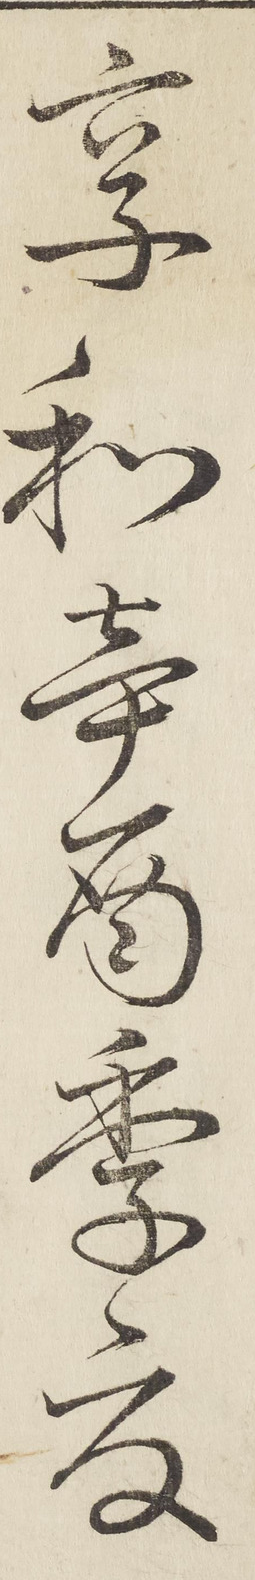享和辛酉季夏
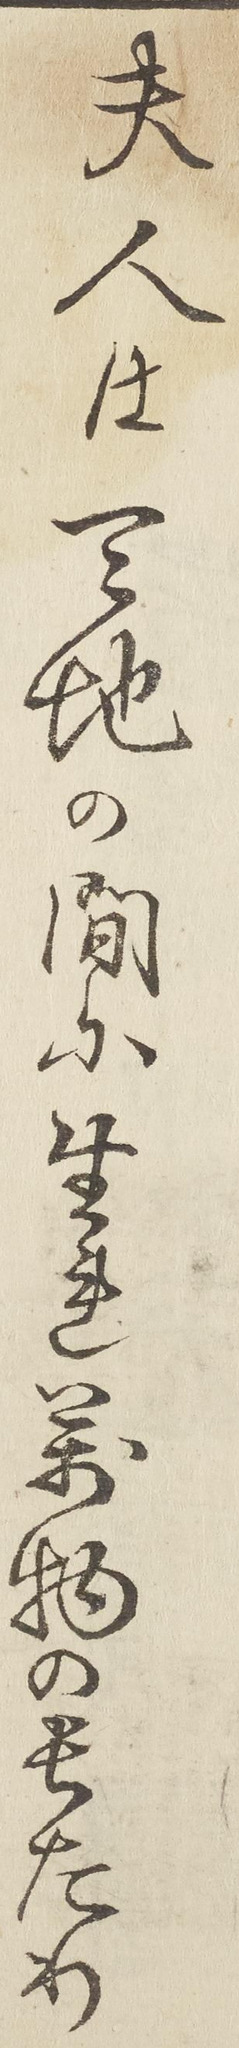夫人は天地の間に生れ万物の長たり
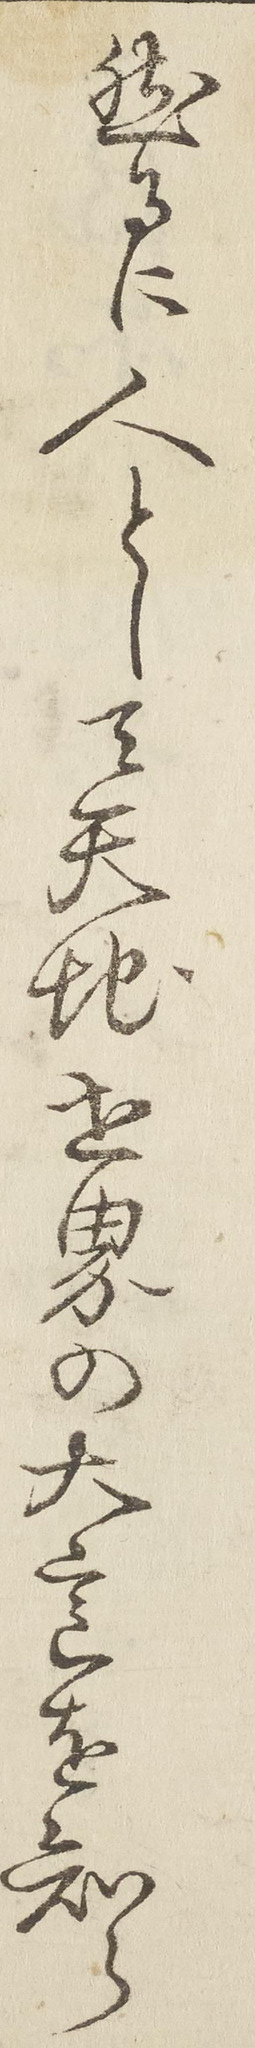然るに人として天地世界の大意を知ら
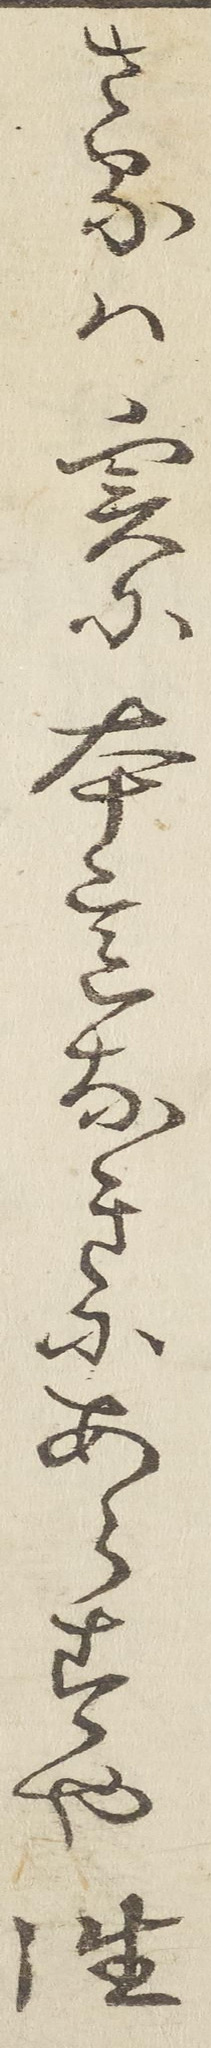さるは実に本意なきにあらすや往
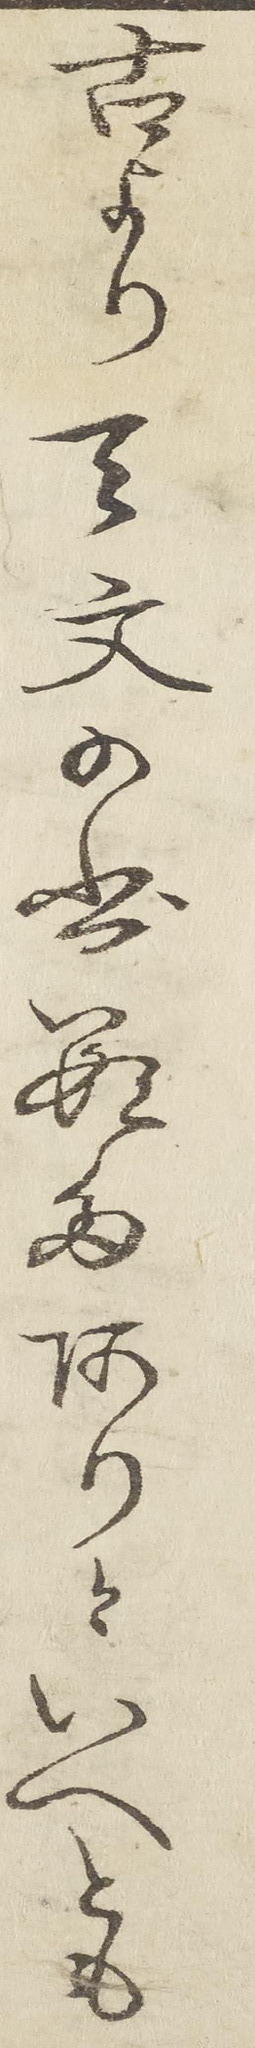古より天文の書数多ありといへとも
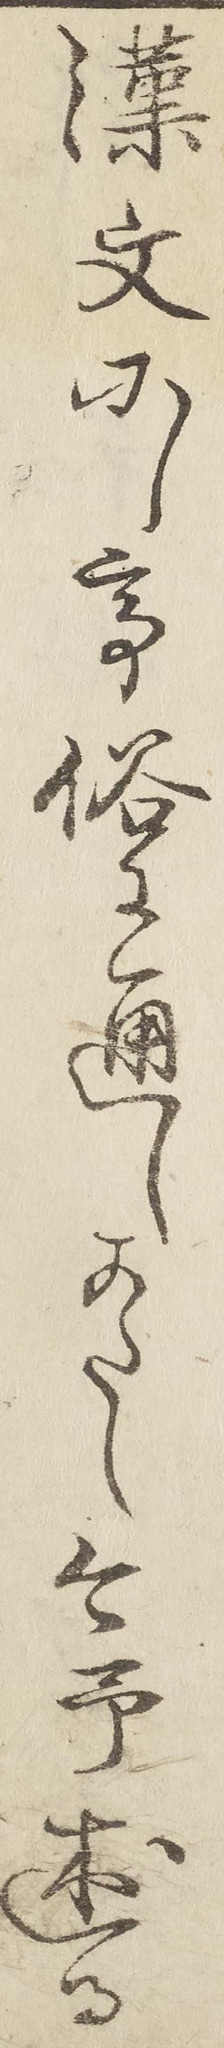漢文にして俗に通しかたし今予述る
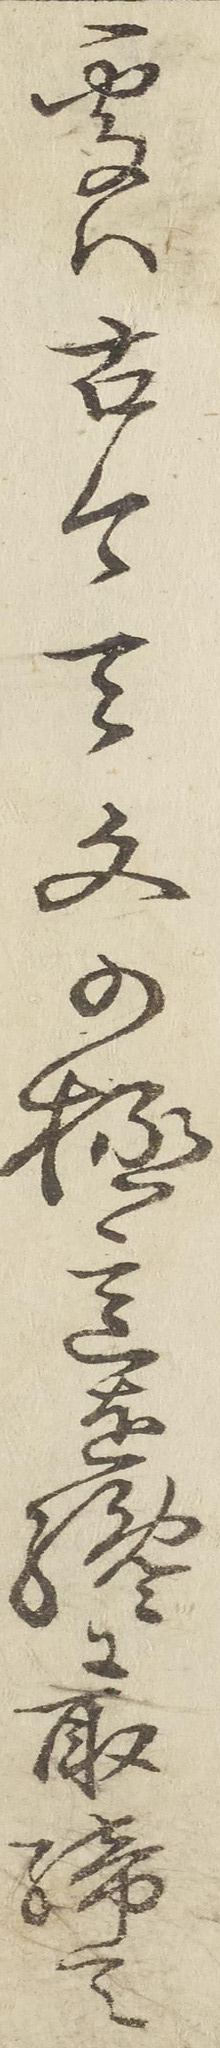処は古今天文の極意を纔に取締て

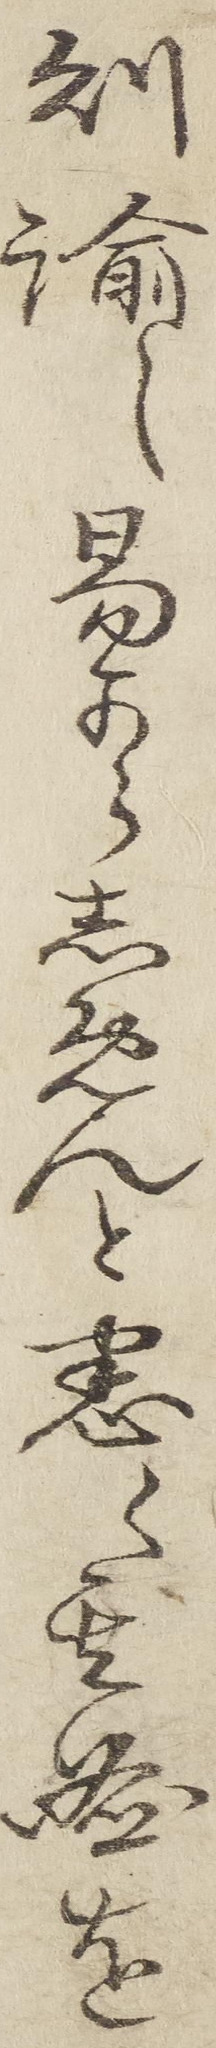則諭し易からしめんと悉く其図を
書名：平天儀圖解
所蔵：東京大学地震研究所図書室 Earthquake Research Institute Library, The University of Tokyo, JAPAN
